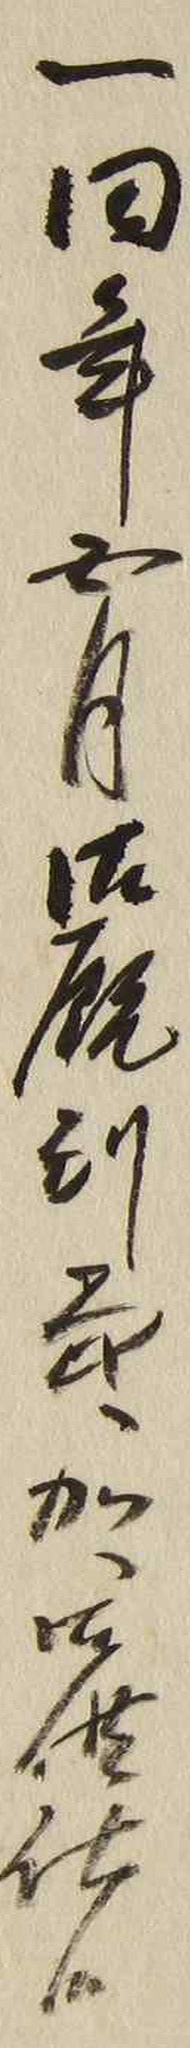一同年五月御厩別当へ加へ御供仕候

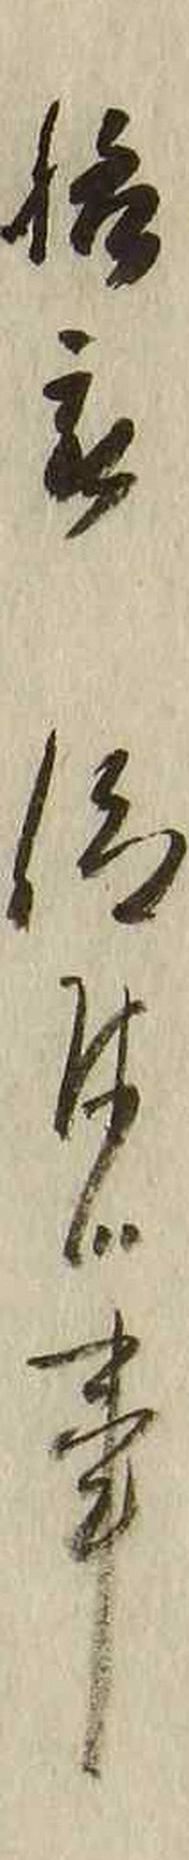様被仰付候事
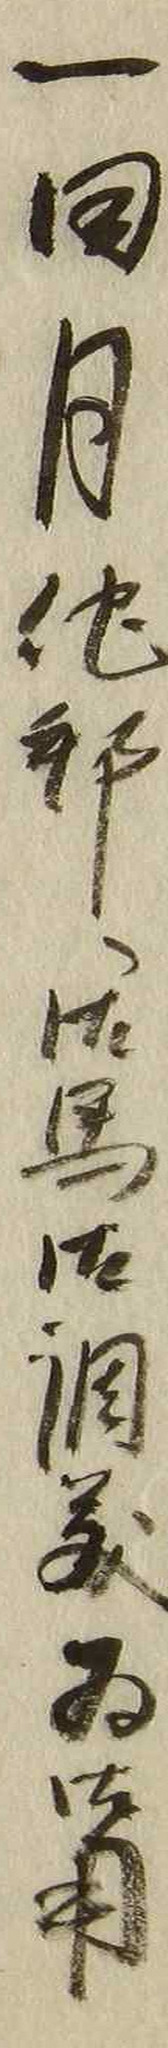一同月徒野へ御馬御調義為御用
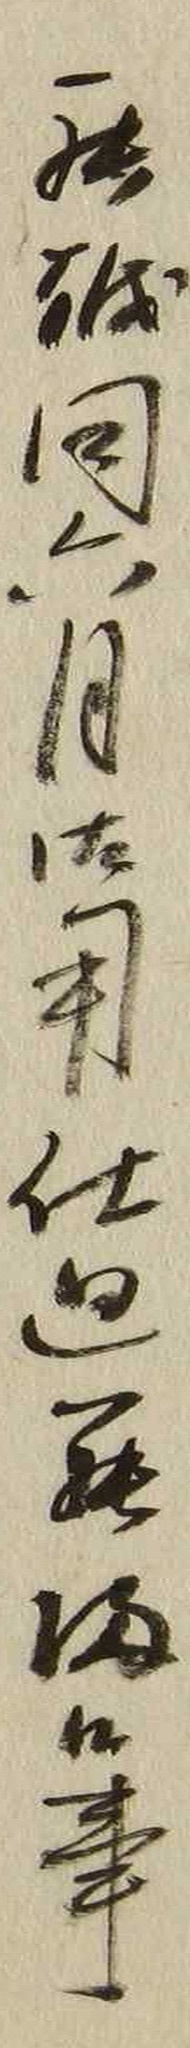罷越同六月御用仕廻罷帰候事
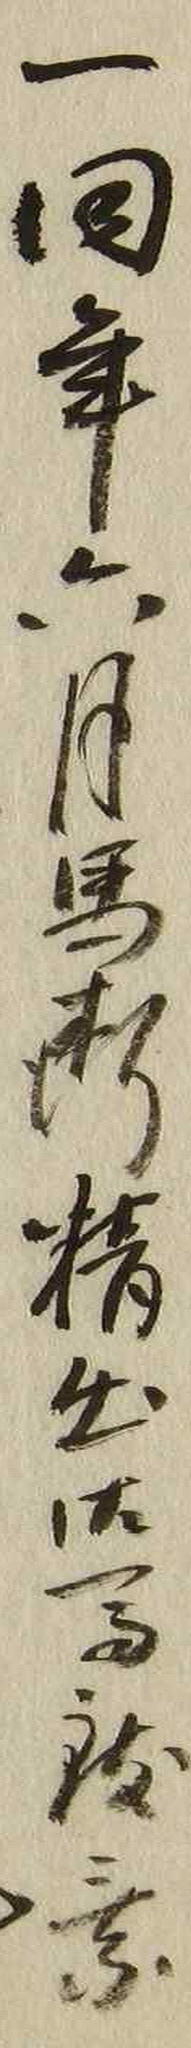一同年六月馬術精出御馬致乗
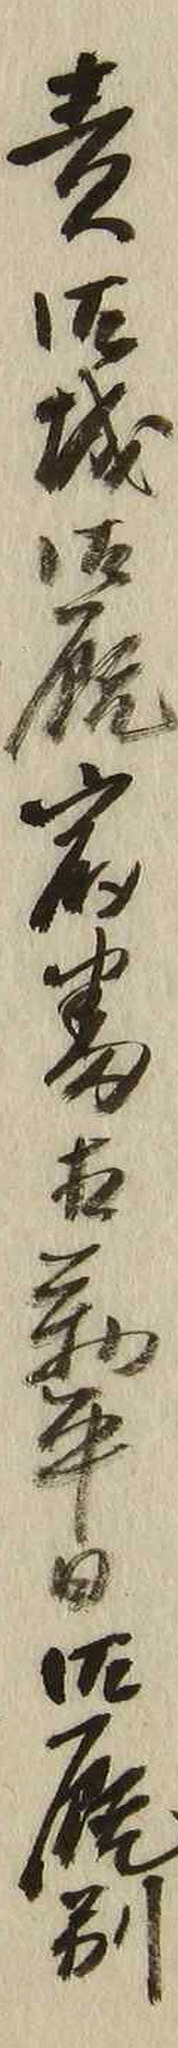責御城御厩当番相勤平日御厩別
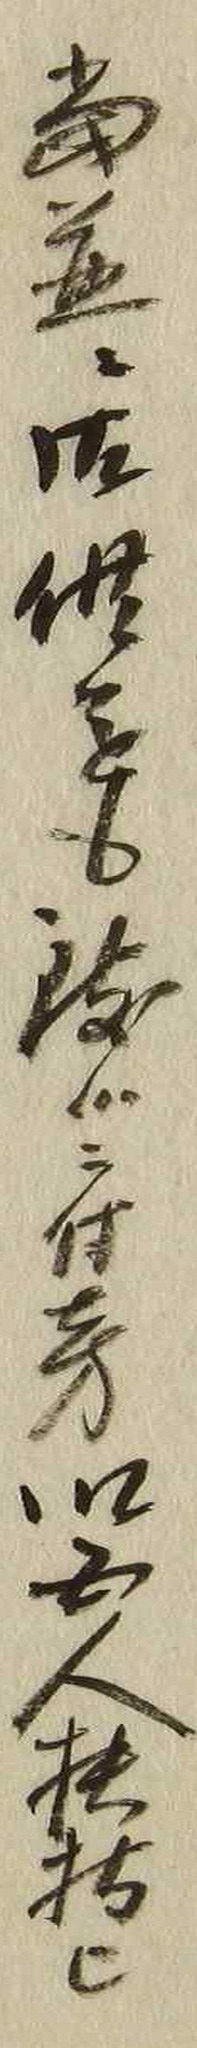当並に御供をも致候に付旁以五人扶持被
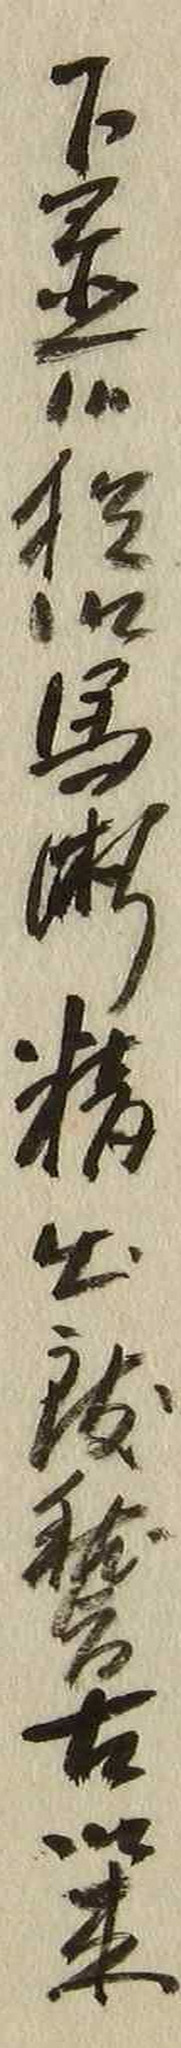下置候猶御馬術精出致稽古以来
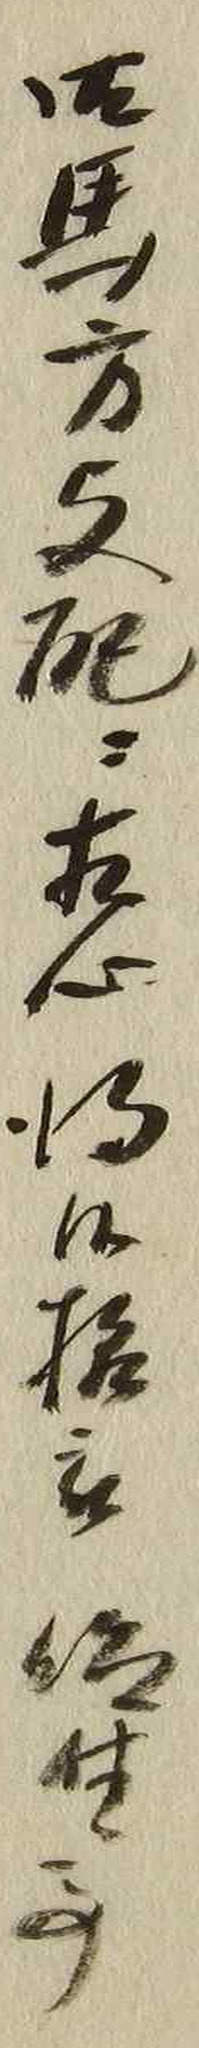御馬方支配に相心得候様被仰付候事
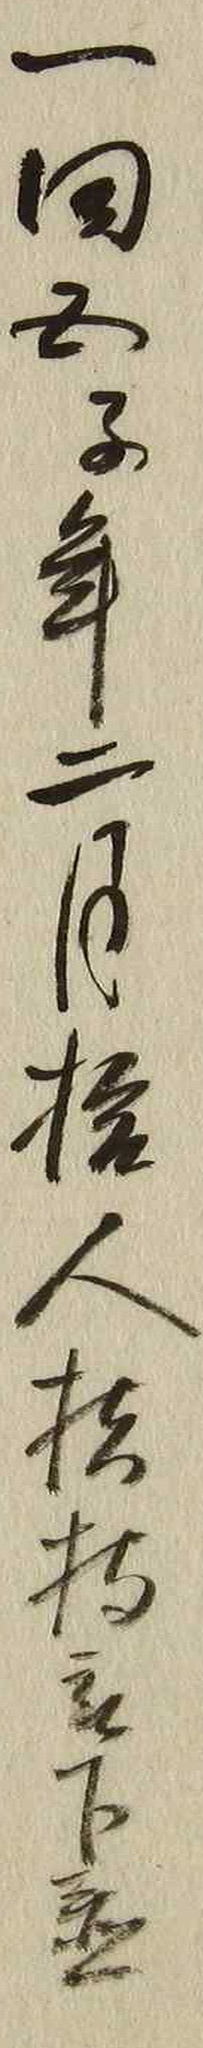一同五子年二月拾人扶持被下置
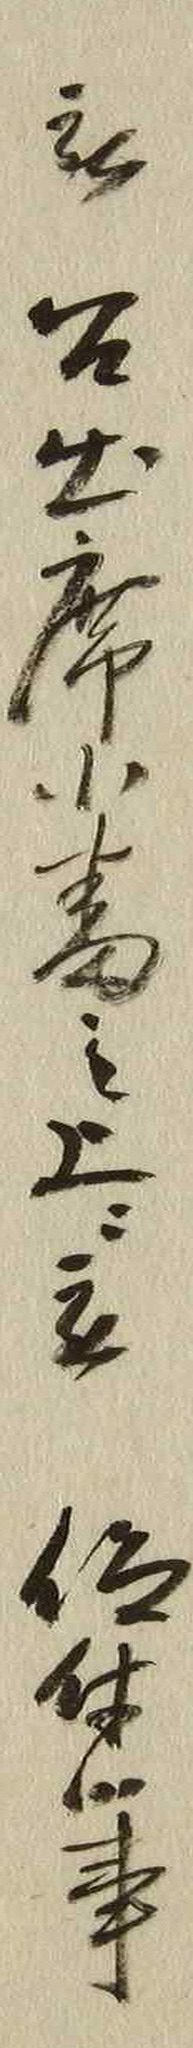被召出席小番之上に被仰付候事
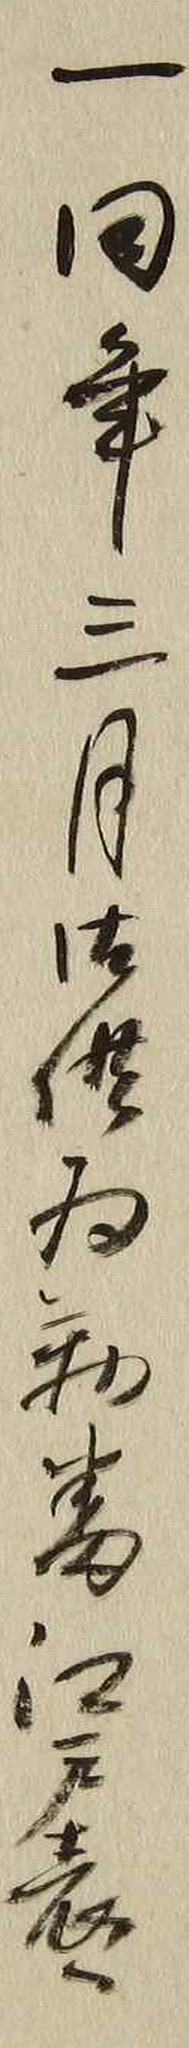一同年三月御供為勤番江戸表へ
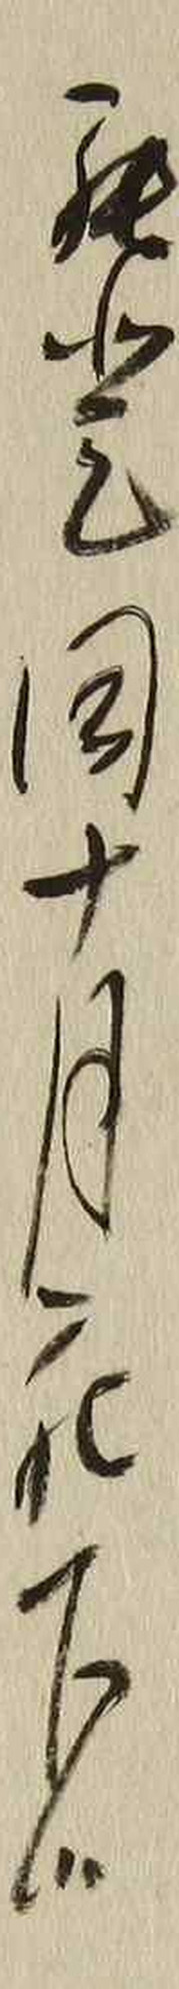罷登同十月罷下候
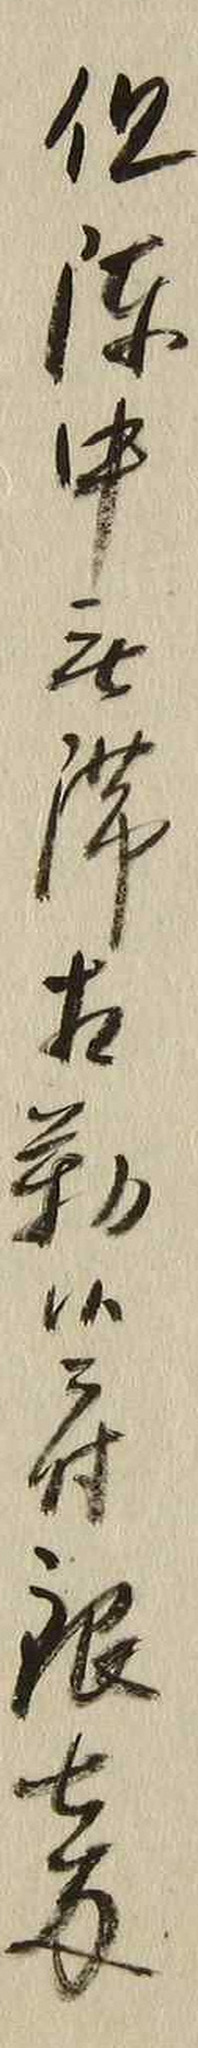但陣中無滞相勤候に付銀七匁
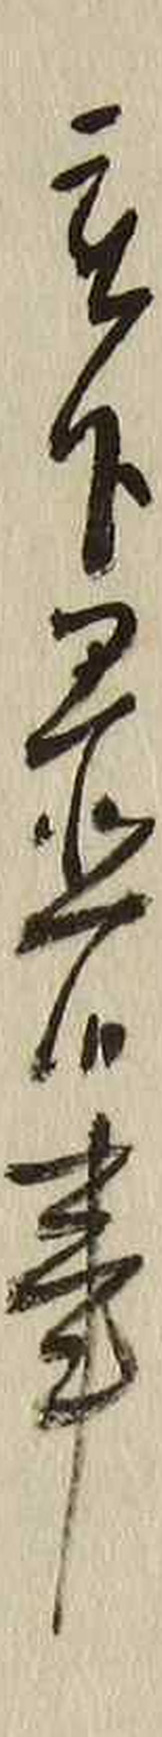被下置候事
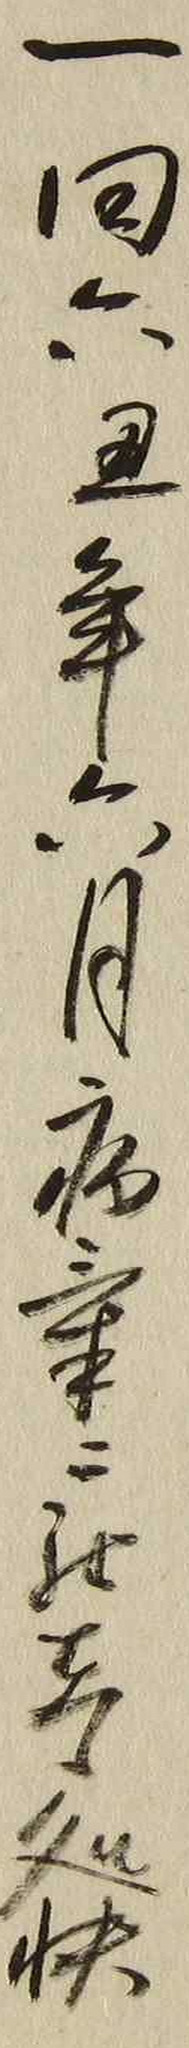一同六丑年六月病気に罷在候処快
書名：諸士系譜　巻之360　す之部10
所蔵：会津若松市立会津図書館
